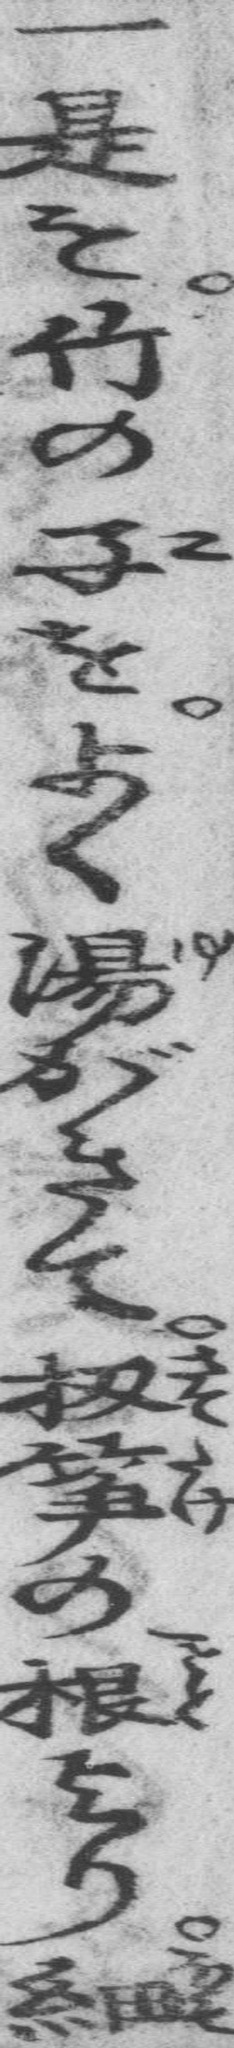一是も。竹の子を。よく湯がきて。扨笋の根より。細
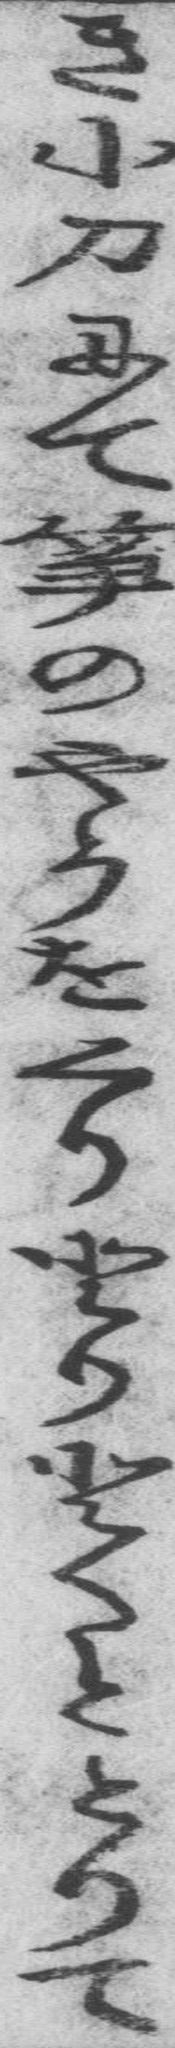き小刀にて。笋のやうを。くりとり。とくととりて。
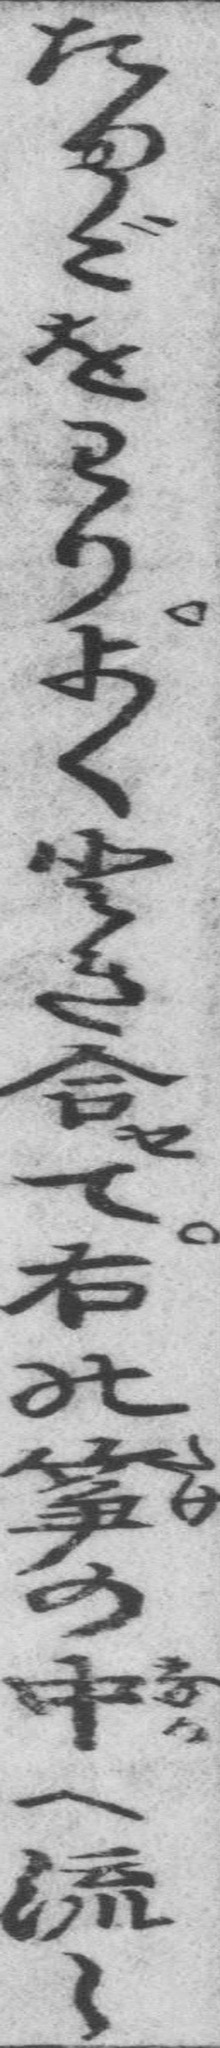たまごをわり。よくとき合せて。右の笋の中へ流し
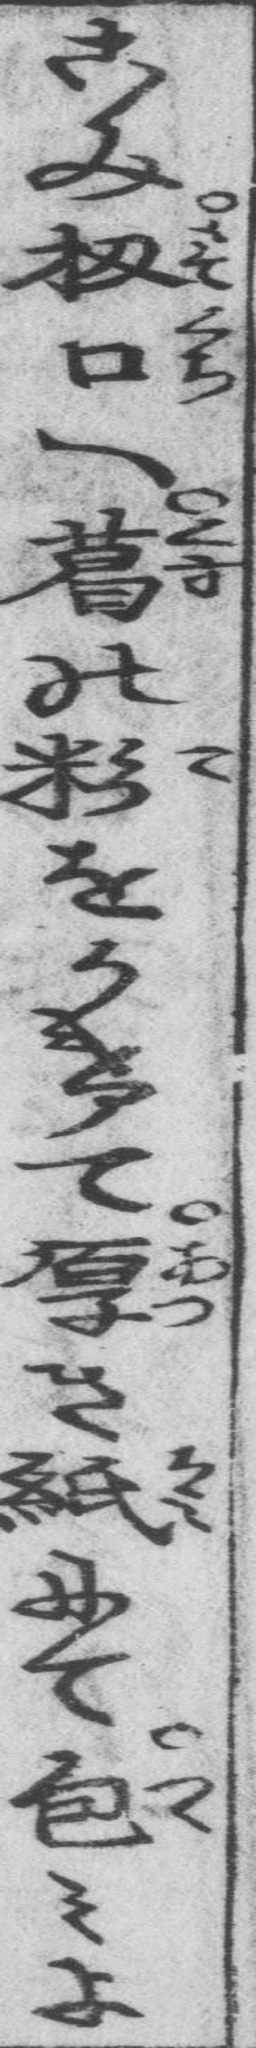こみ。扨口へ。葛の粉をかけて。厚き紙にて。包みよ
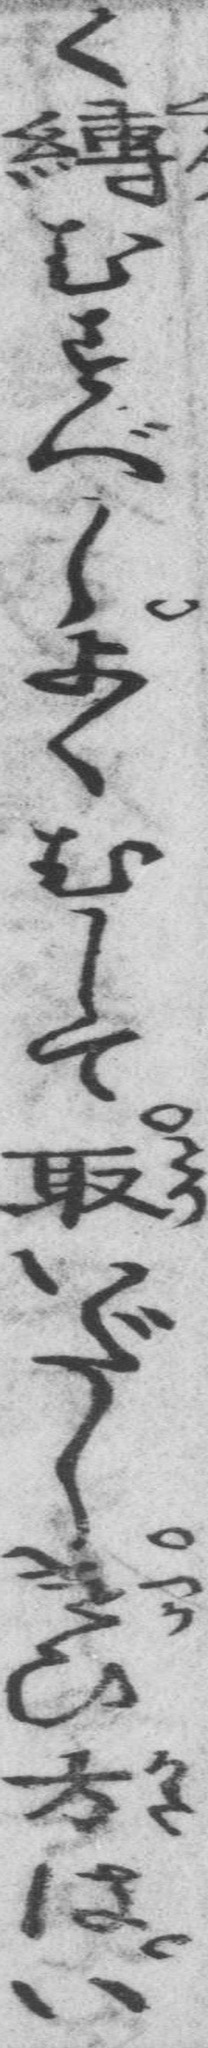く縛むすべし。よくむして。取いだし。遣ひ方は。い
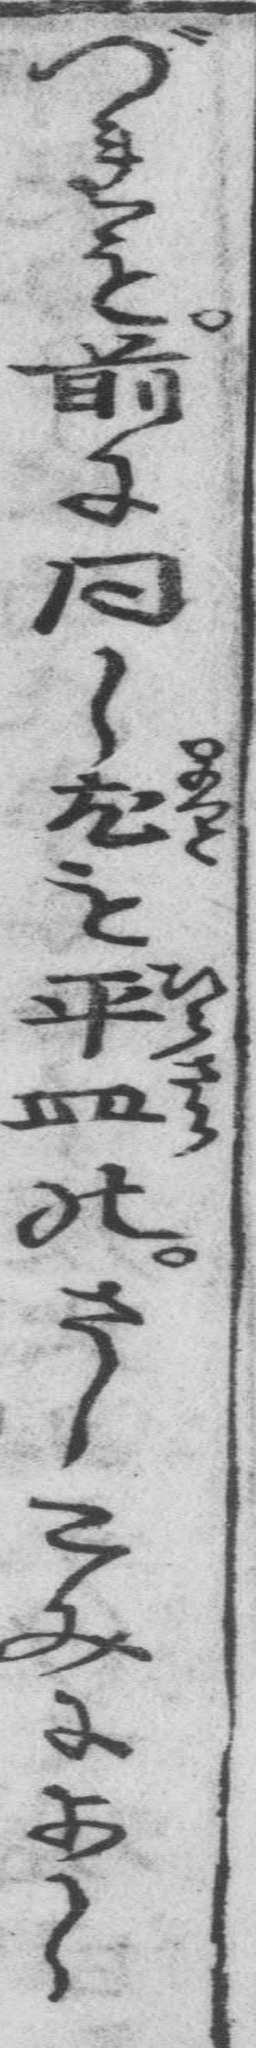づれも。前に同し。尤も平皿の。さしこみによし
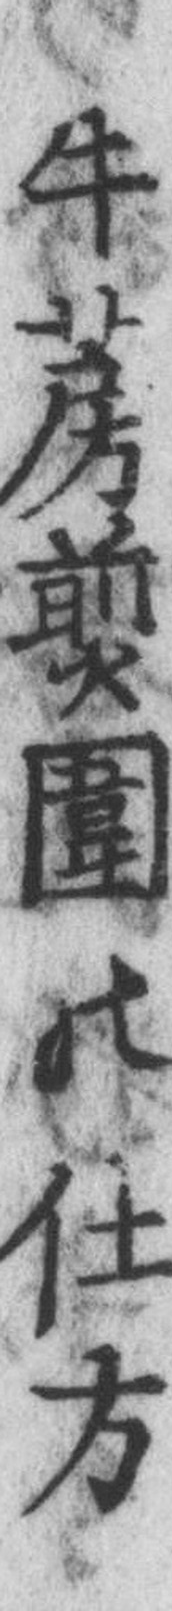牛房煎囲の仕方
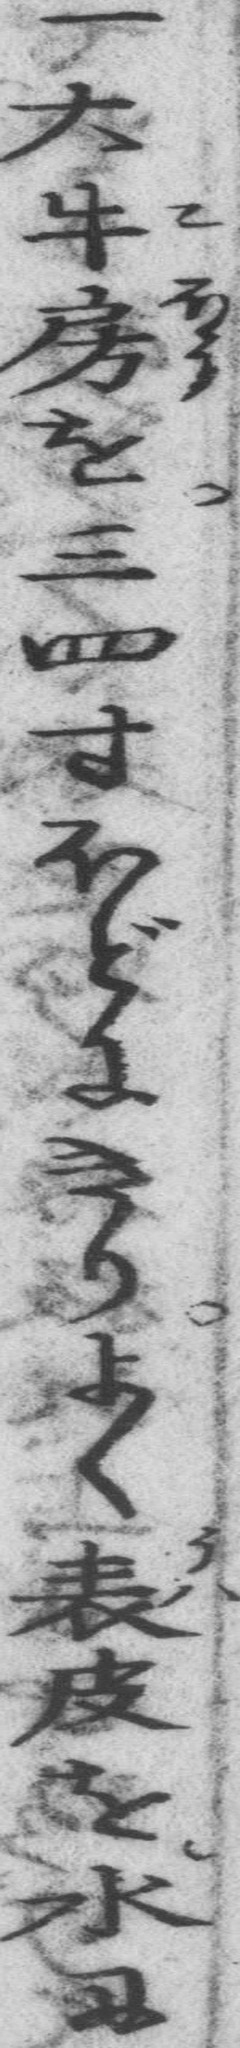一大牛房を。三四寸ほどにきり。よく表皮を。水に
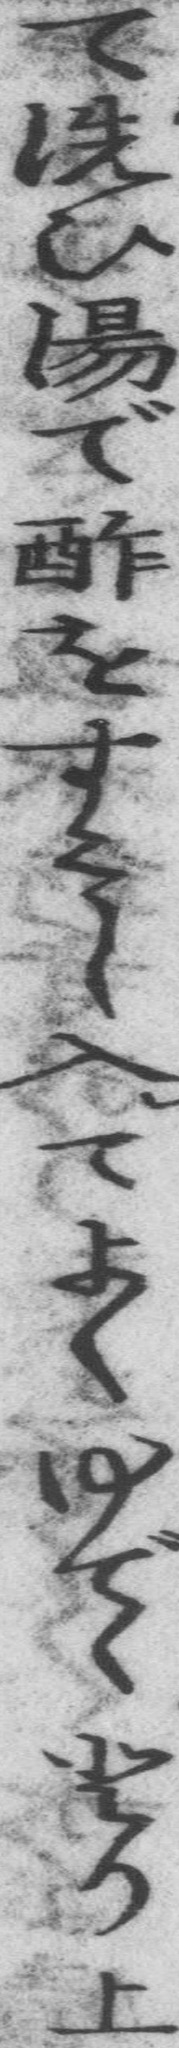て洗ひ。湯で。酢をすこし入れてよくゆでゝ。とり上
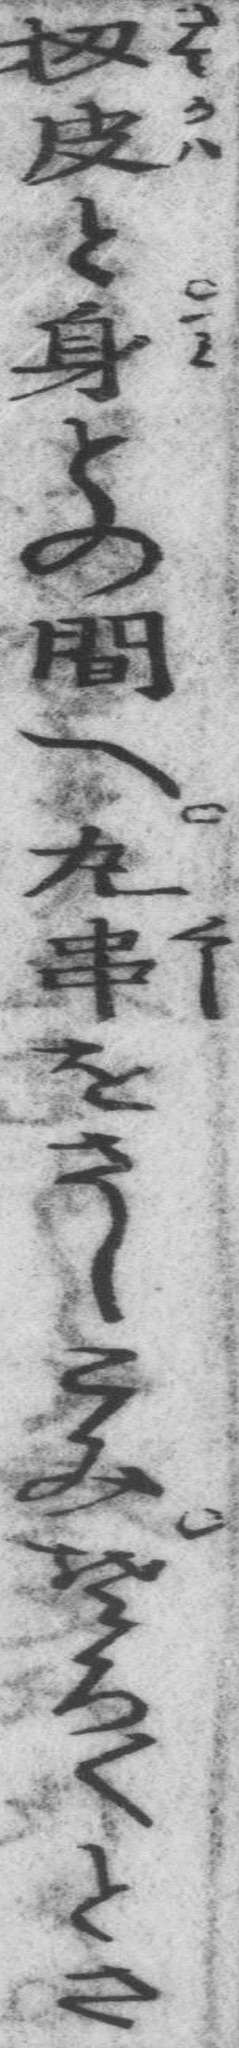扨皮と。身との間へ。丸串をさしこみ。そろ〳〵とさ
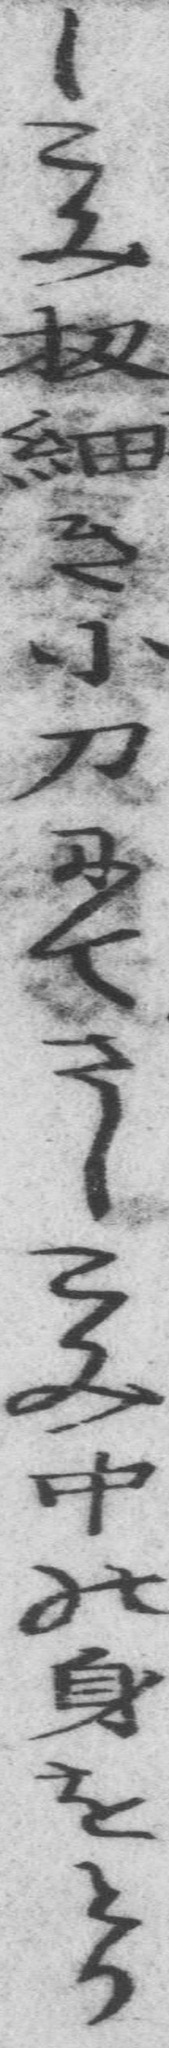しこみ。扨細き小刀にて。さしこみ。中の身をとり
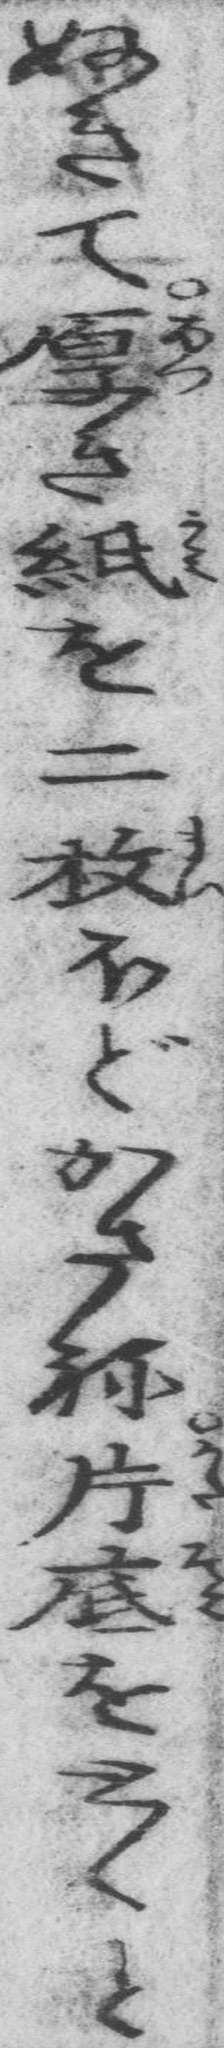ぬきて。厚き紙を二枚ほどかさね。片底をとくと
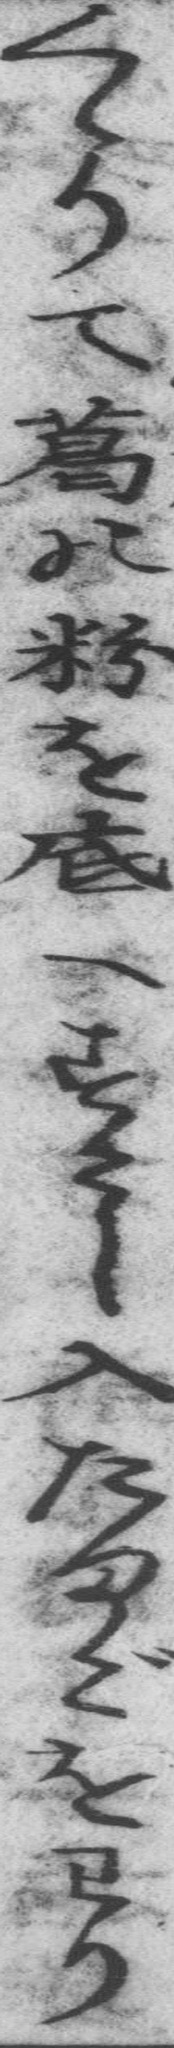くゝりて。葛の粉を底へすこし入れ。たまごをわり
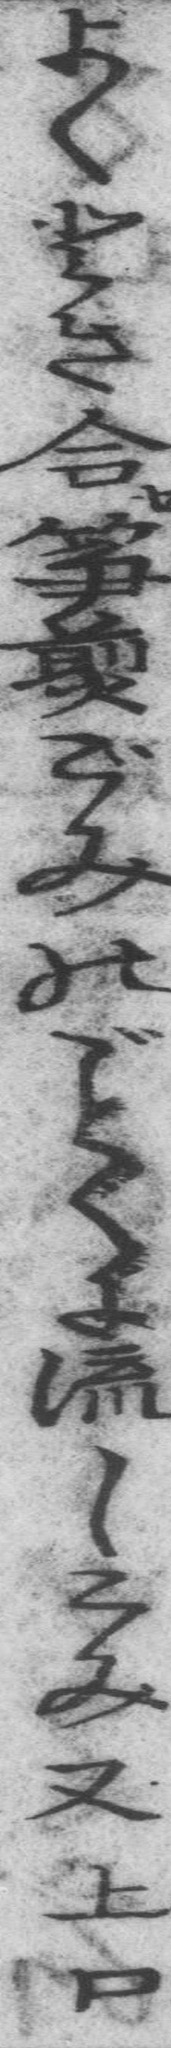よくとき合せ。笋煎ごみのごとくに。流しこみ。又上口
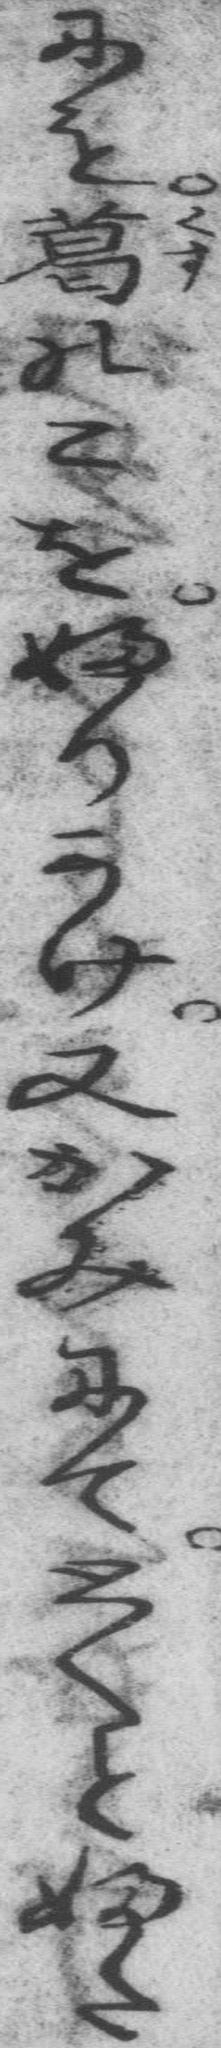にも。葛のこの。ふりかけ。又かみにて。とくとふた

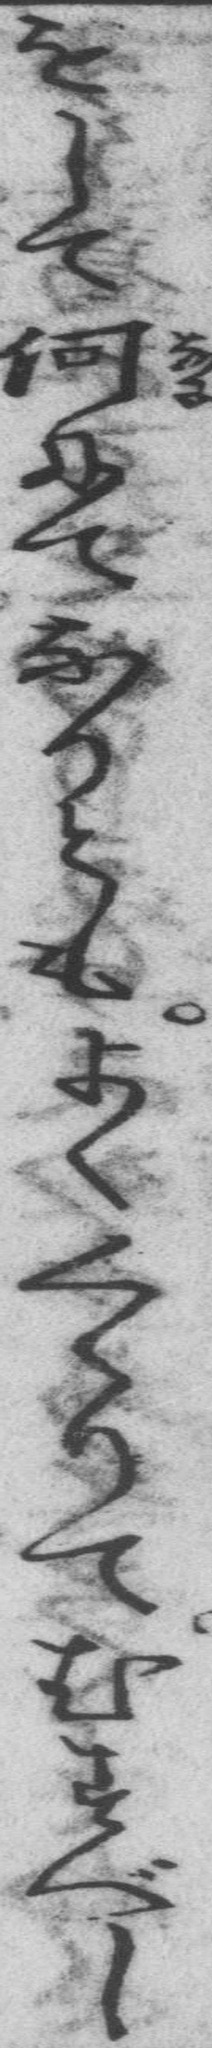もして何にてなりとも。よくゝりて。むすべし
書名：萬寳料理秘密箱
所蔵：大阪府立大学学術情報センター 国文学研究資料館
